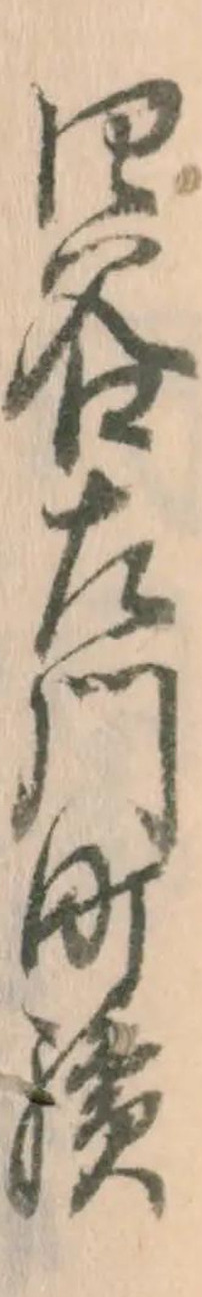四谷左門町続
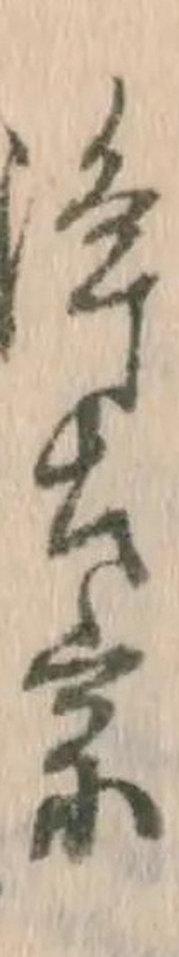浄土宗
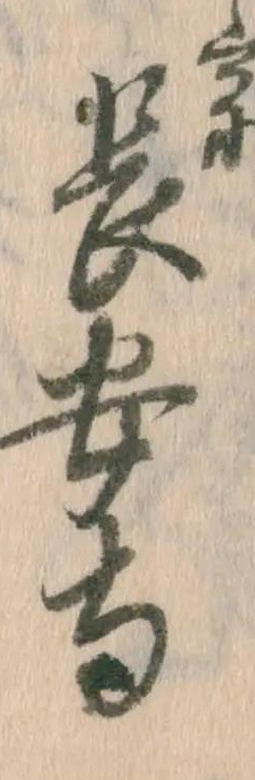長安寺
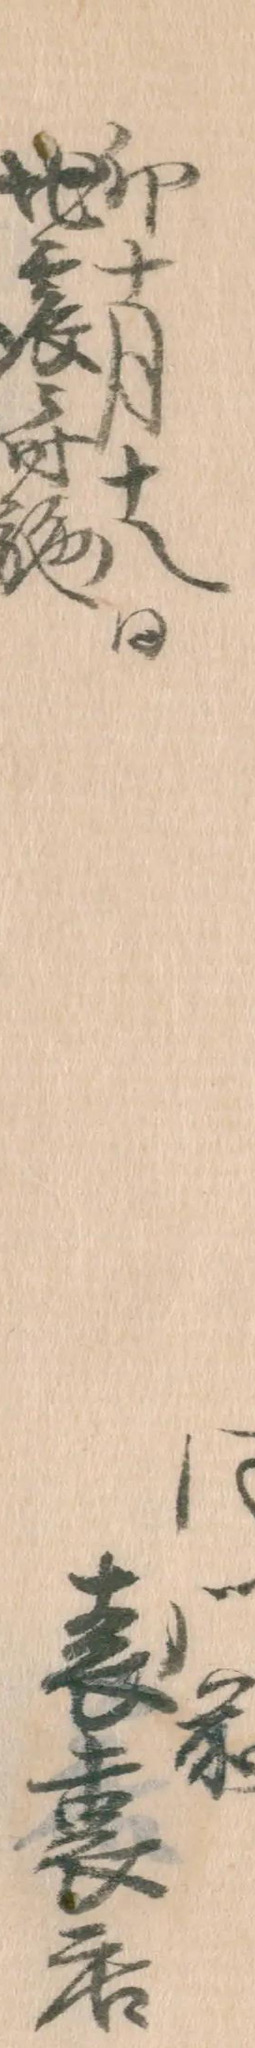地震ニ付施表裏店
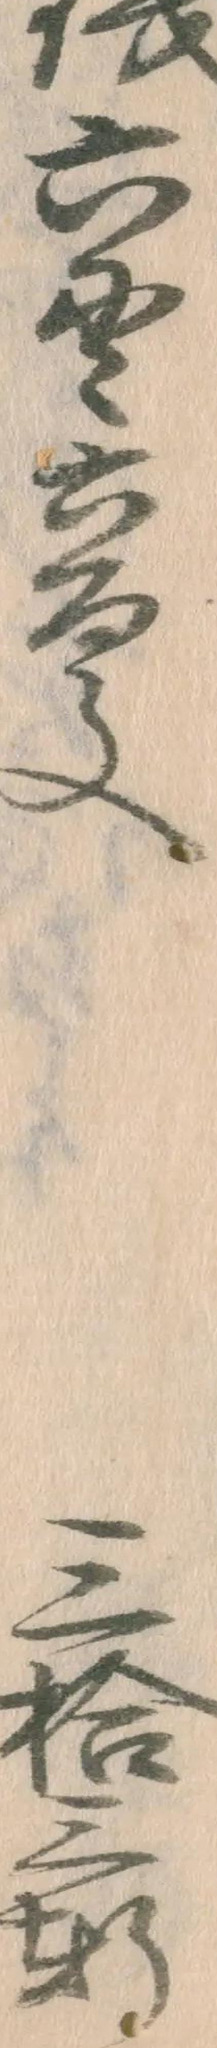一銭六貫六百文三拾三軒
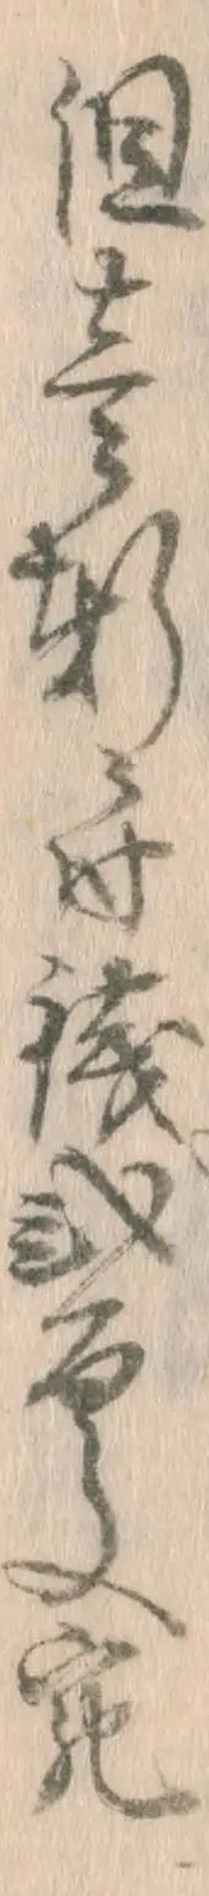但壱軒ニ付銭弐百文宛

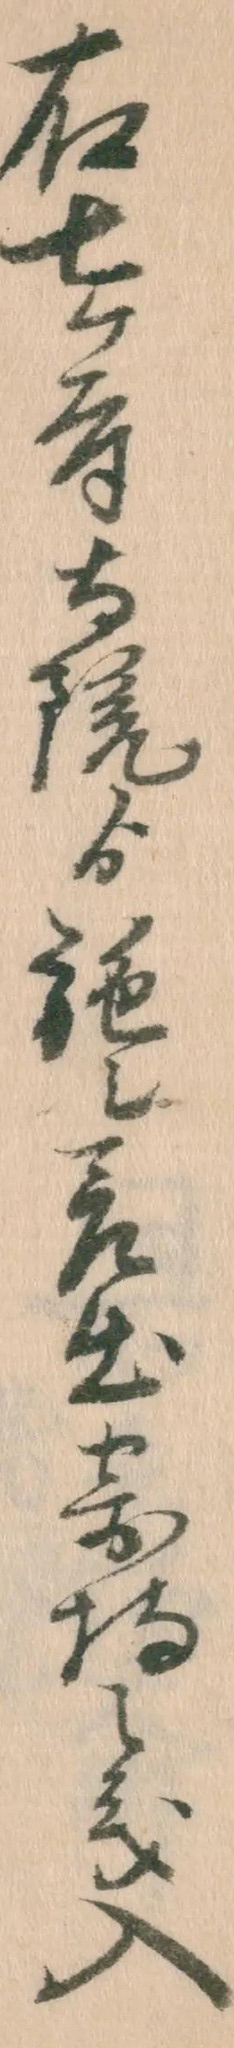右七ケ寺寺院ゟ施シ差出奇特之義入
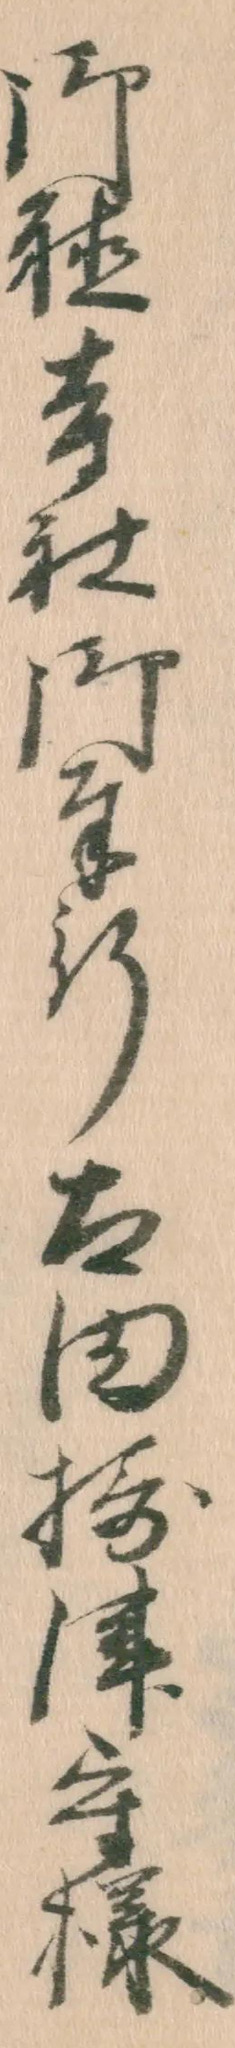御聴寺社御奉行太田摂津守様
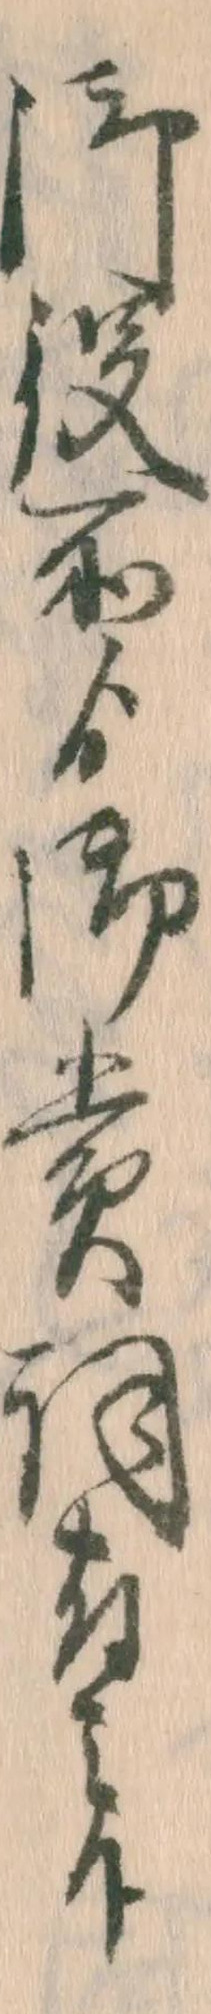御役所ゟ御賞詞有之候
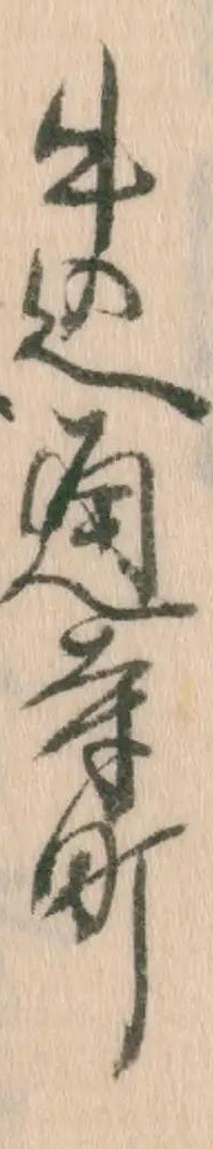牛込通寺町
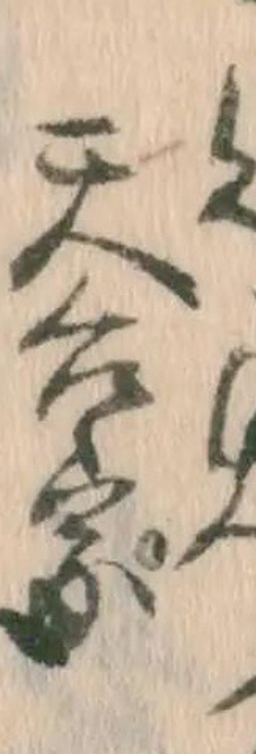天台宗
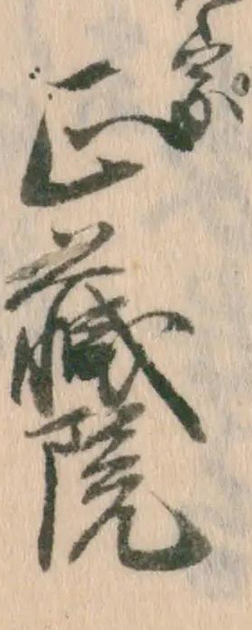正蔵院
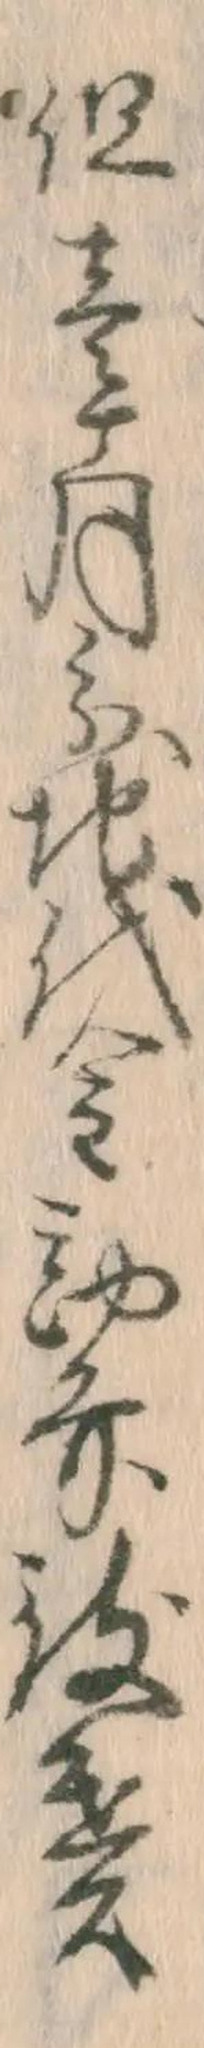但壱ケ月分地代金勘弁致遣ス
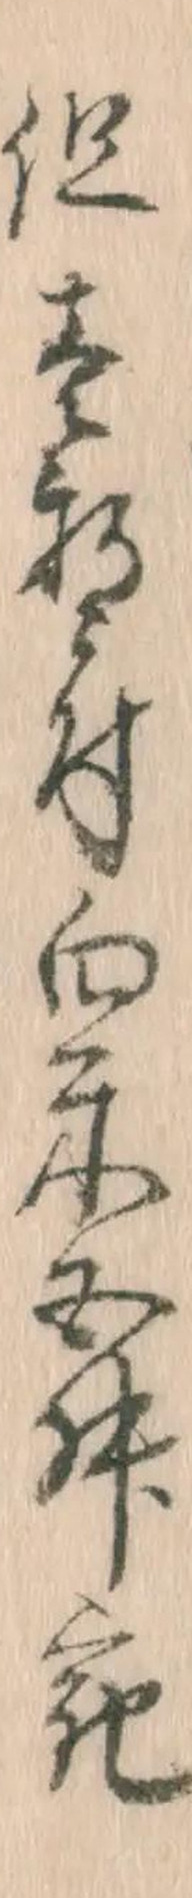但壱軒ニ付白米五升宛
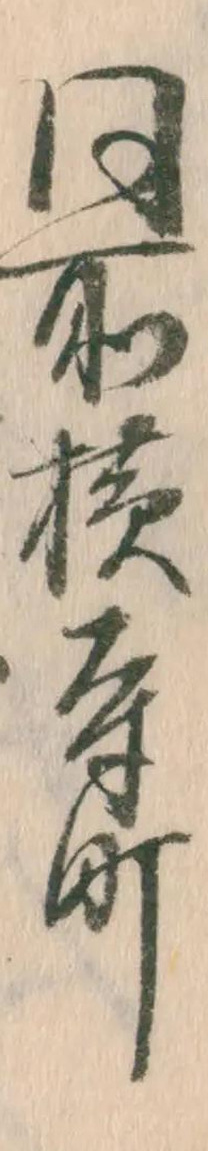同所横寺町
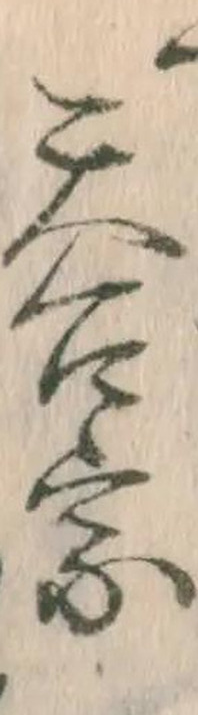天台宗
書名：武家方并寺院等ニテ施差出候一件
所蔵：国立国会図書館 National Diet Library, JAPAN
